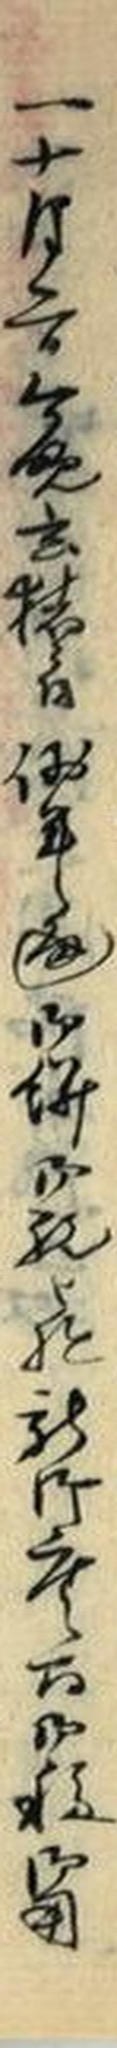一十月二日今晩玄猪ニ付例年之通御餅御祝被遊新御座之間御移御用
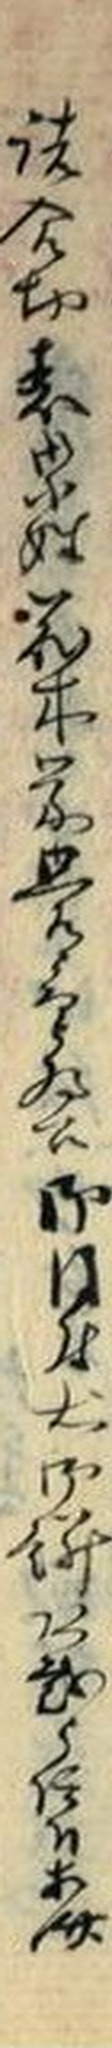詰合切表御小姓花木栄思召ニ而被為召御同座右御餅頂戴被仰付相済
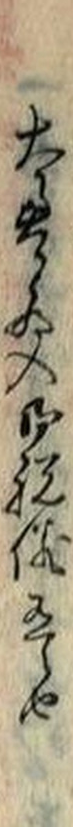大奥へ被為入御祝儀有之由
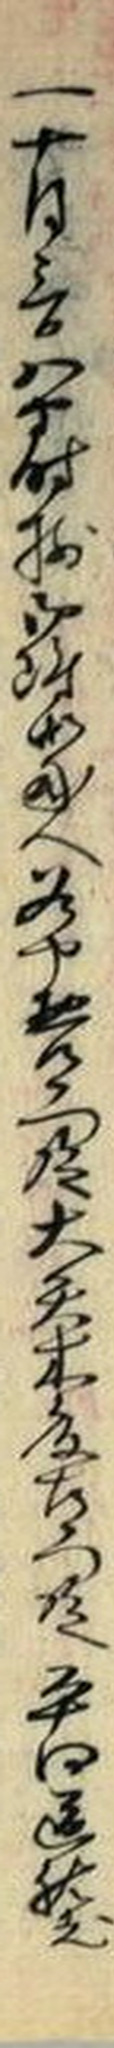一十月三日八半時揃御附御用人谷中惣左衛門殿大矢木藤左衛門殿平田道祐老
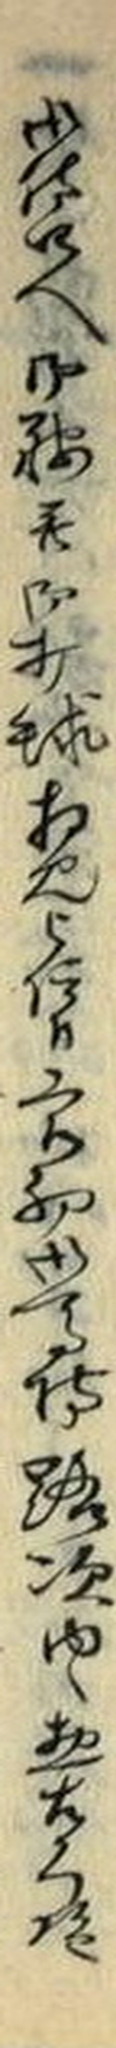御侍四人御鞍并御打毬拝見被仰付最初御馬侍路次内へ惣左衛門殿
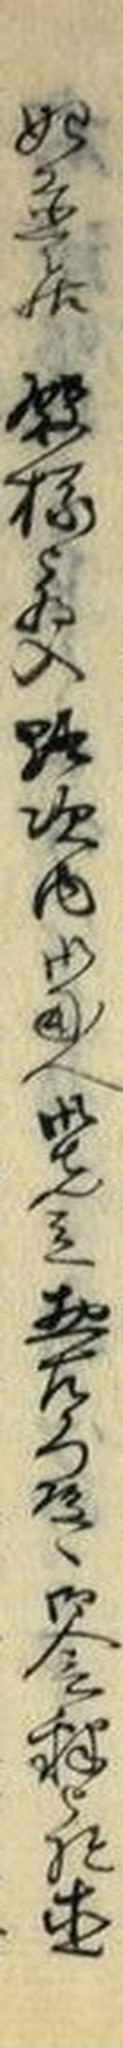始並居殿様被為入路次内御用人御先立惣左衛門殿へ御会釈被遊直
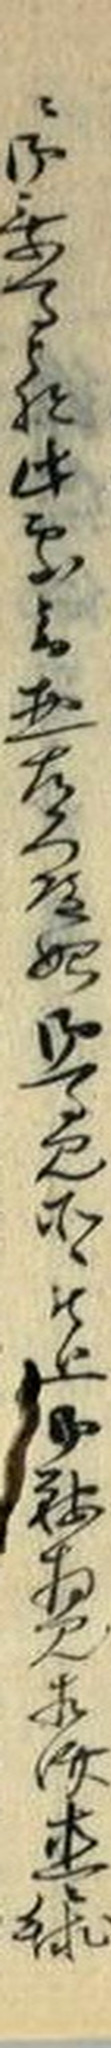ニ御乗馬被遊此処ニ而惣左衛門殿始御馬見所へ被上御鞍拝見相済直ニ毬
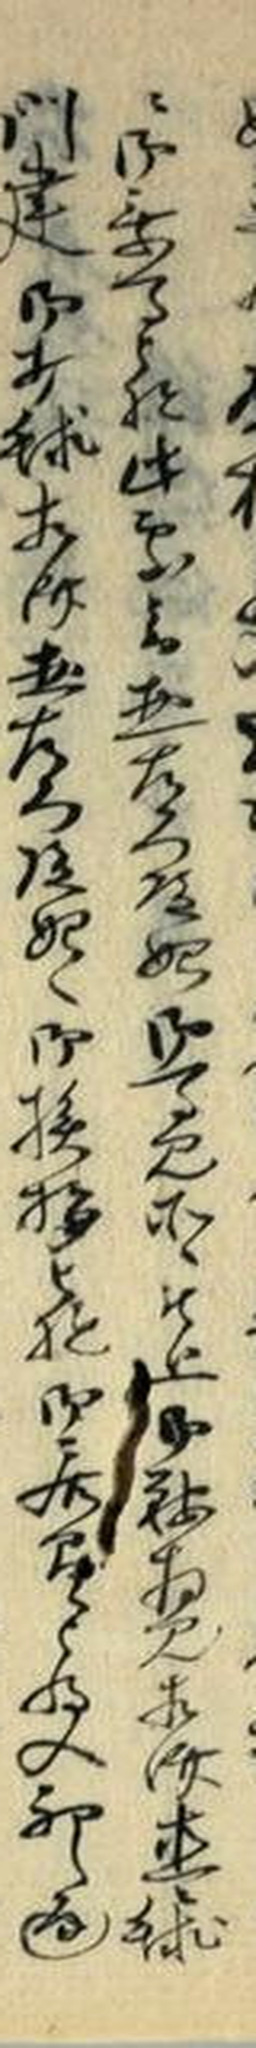門建御打毬相済惣左衛門殿始へ御挨拶被遊御居間へ被為入初之通
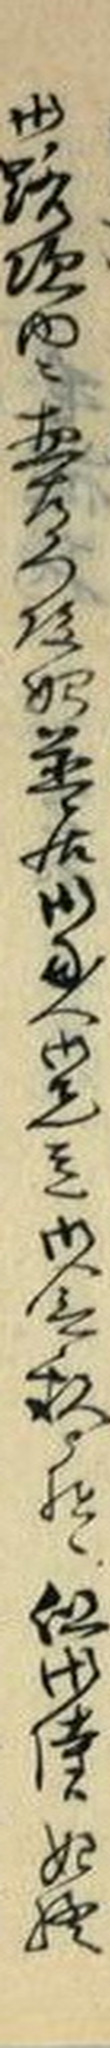御路次内ニ惣左衛門殿始並居御用人御先立御会釈被遊候但御侍ハ始終
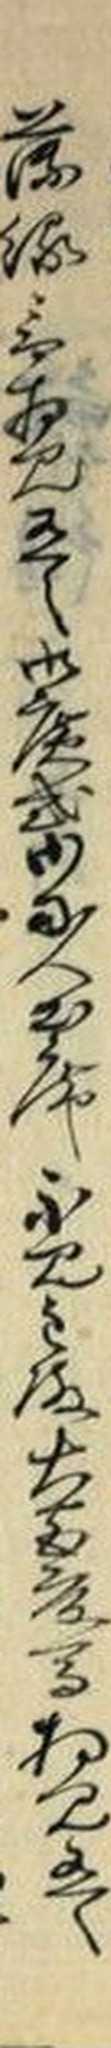薄縁ニ而拝見有之御広式御用人出席永見主殿大宮藤馬拝見有之
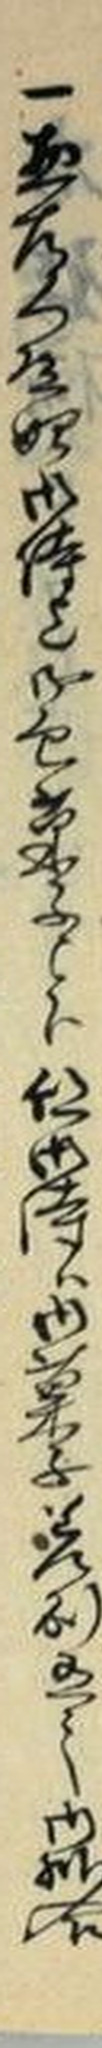一惣左衛門殿始御侍迄御包菓子被下但御侍ハ御菓子差別有之御掛合
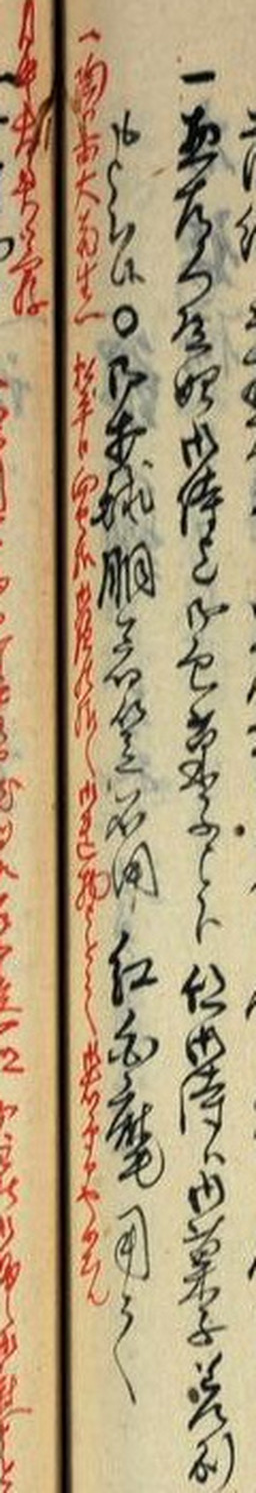も被下候〇御打毬胴着笠不用紅白麾用之
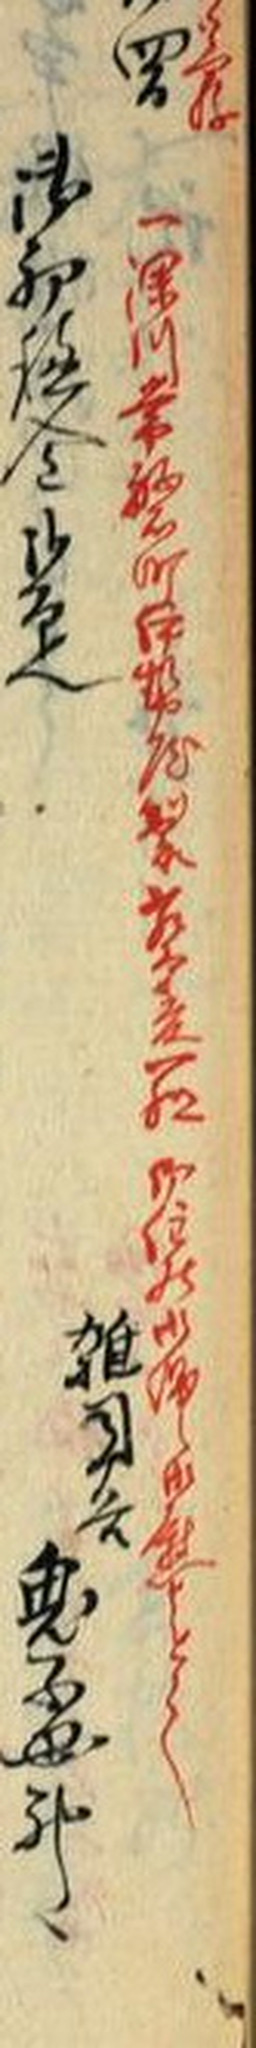御初穂金弐百疋雑司谷鬼子母神
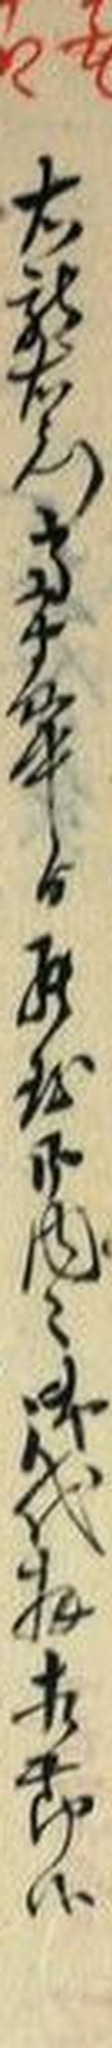右新右衛門当番中ゟ罷越御内々御代拝相勤候
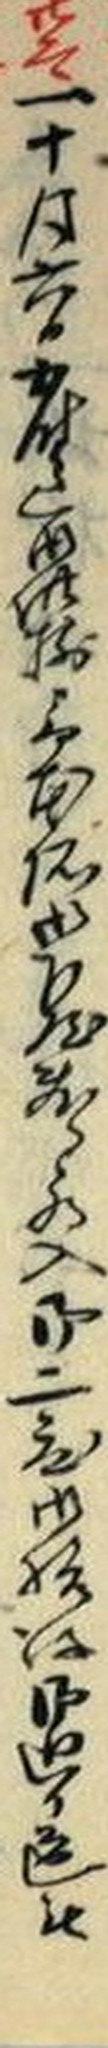一十月六日五時過御供揃ニ而本所御下屋敷へ被為入御二度御膳後御廻り道被
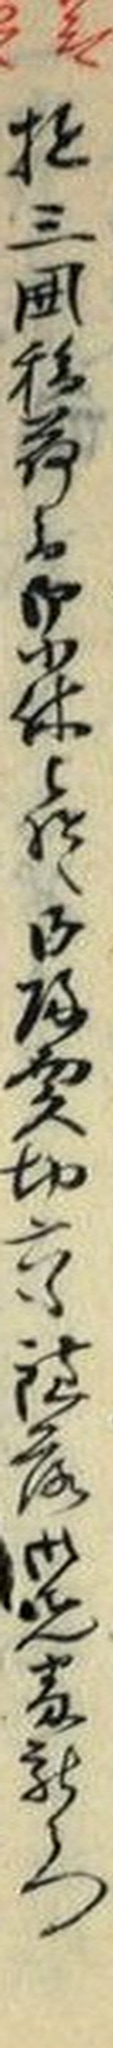遊三囲稲荷ニ而御小休被遊候御帰殿切六ツ鎌落御先番新右衛門
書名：少傅日録抄（斉承付側向頭取日記、在府）
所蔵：福井県文書館 Fukui Prefectural Archives
